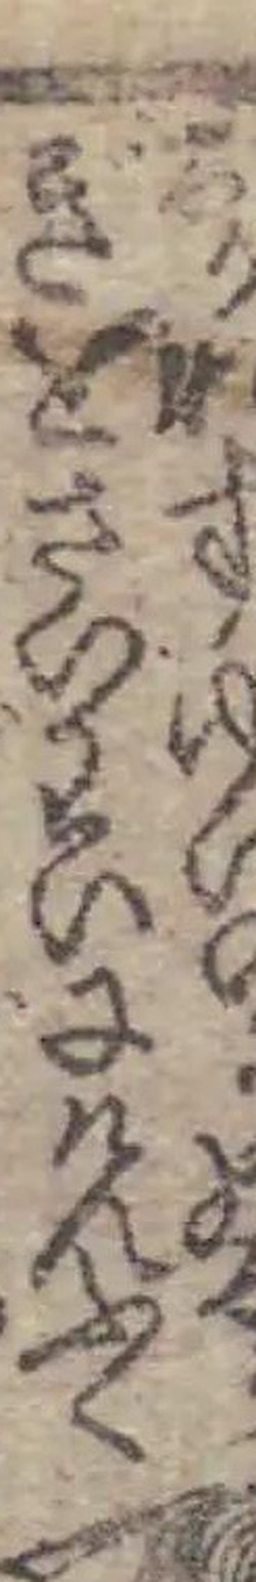ぎをさいわいにけんふく
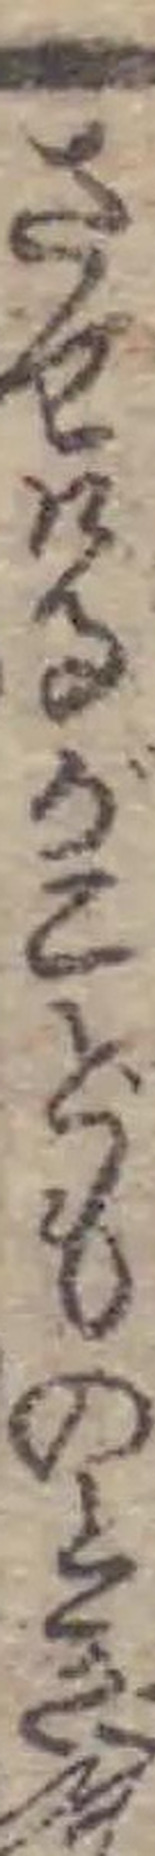させけるがこどものとき
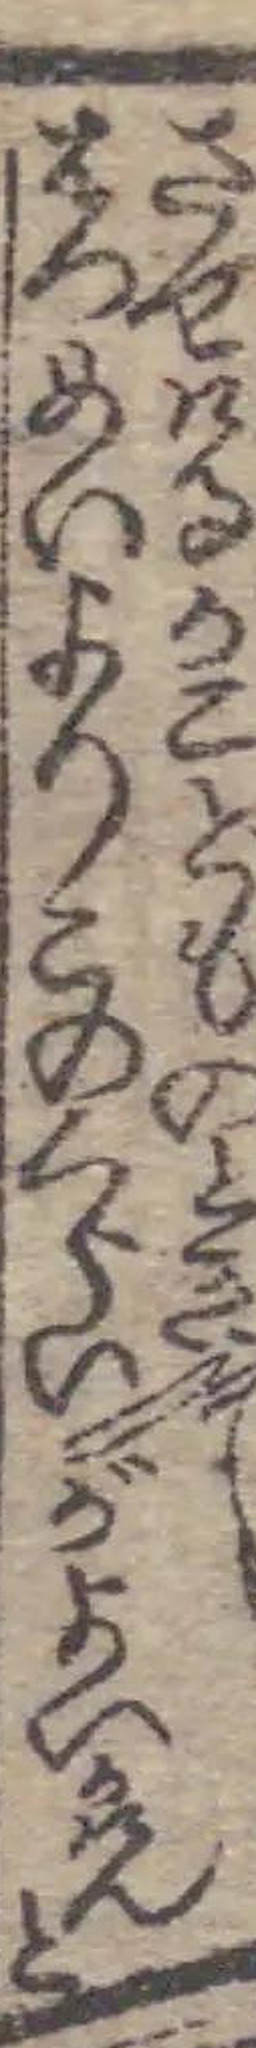はつめいよりこのくらいがよいかけんと
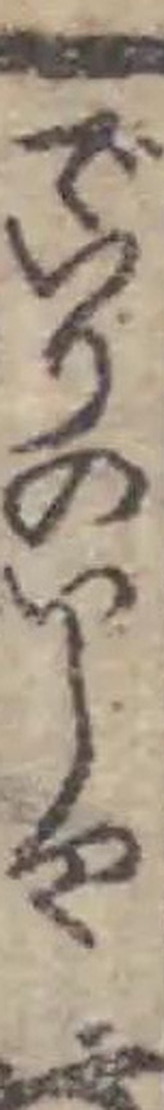でいりのいしや
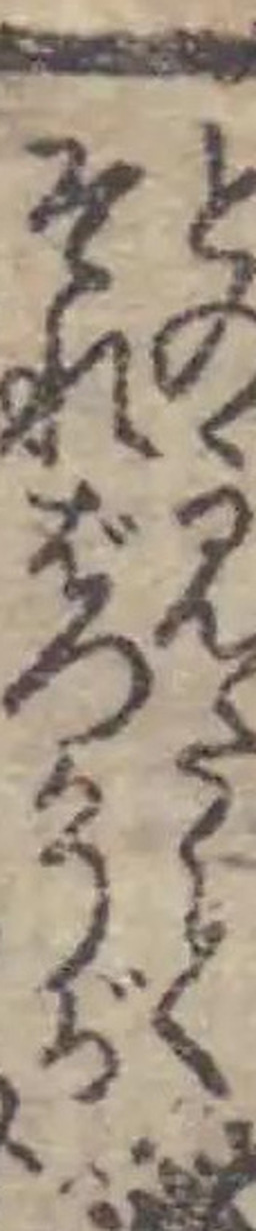そればつかりが
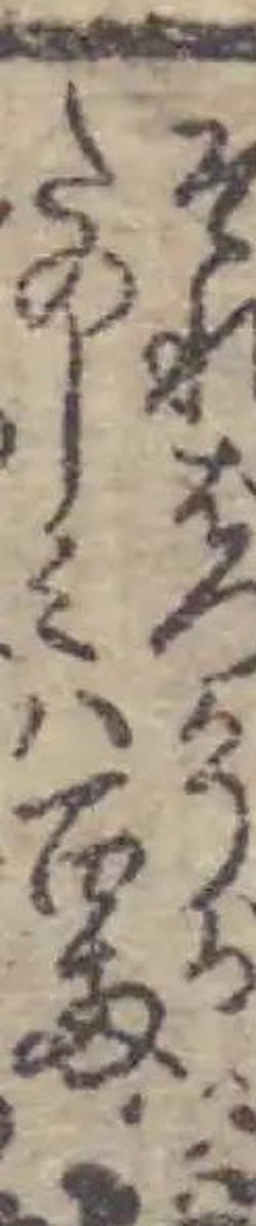たのしみは百両
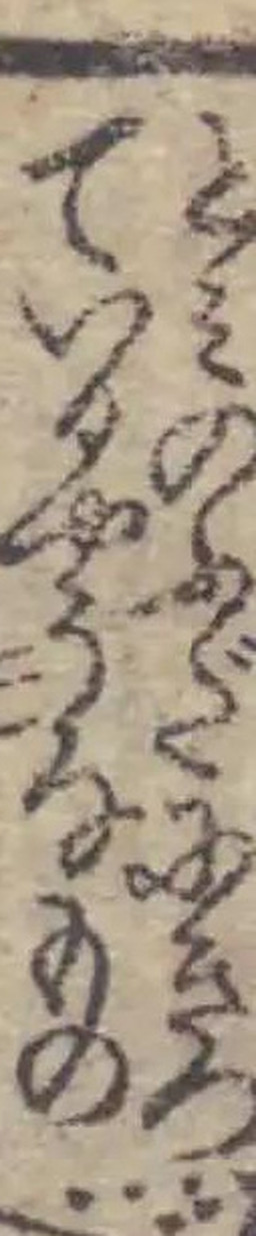ているやうなもの
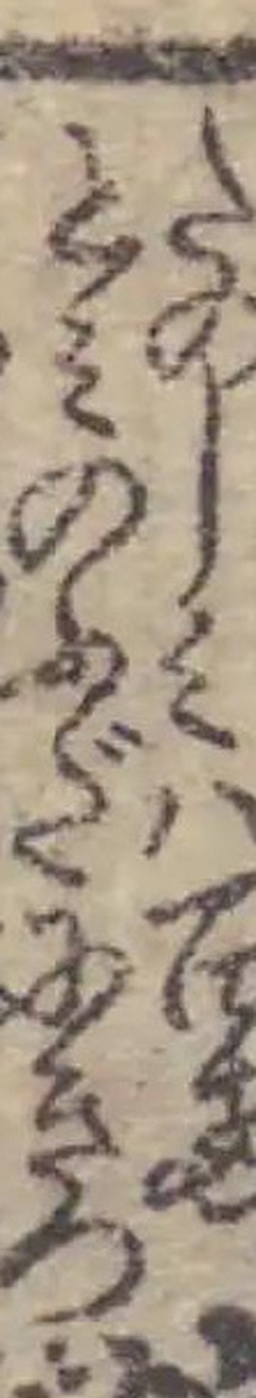とみのふだにきつ
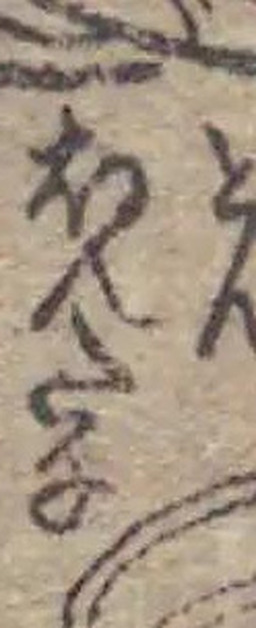ほんたに
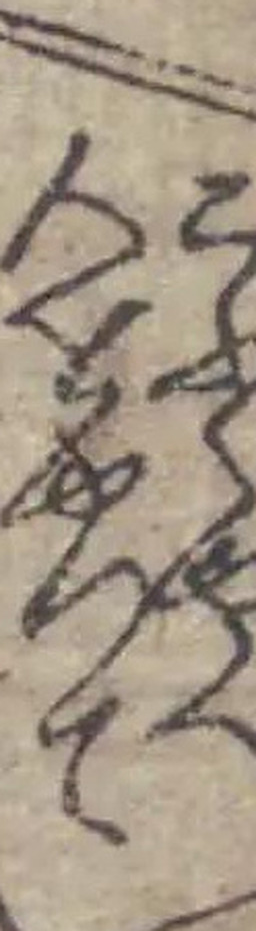人をやつて
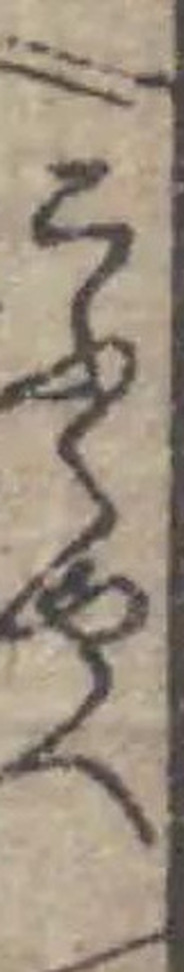こふくやへ
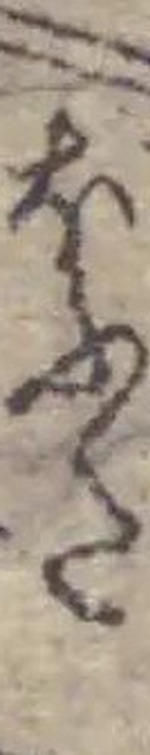ぼふた
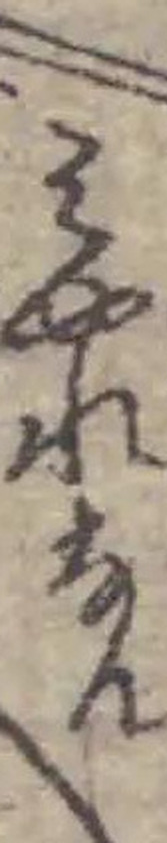みやれなん
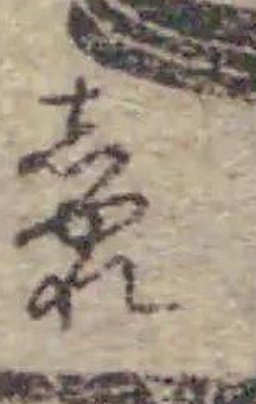しやれ
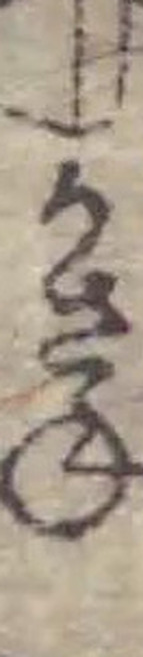かさね
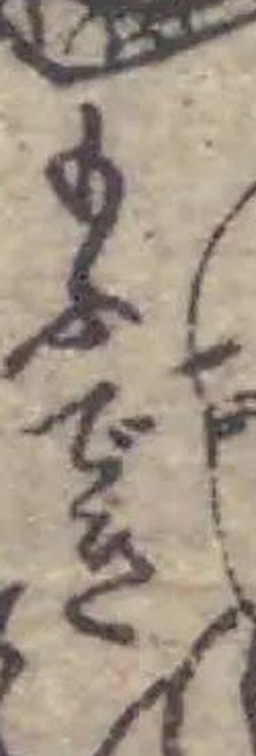もふでき
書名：津以曽無弟の甚六 3巻
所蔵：国立国会図書館 National Diet Library, JAPAN
